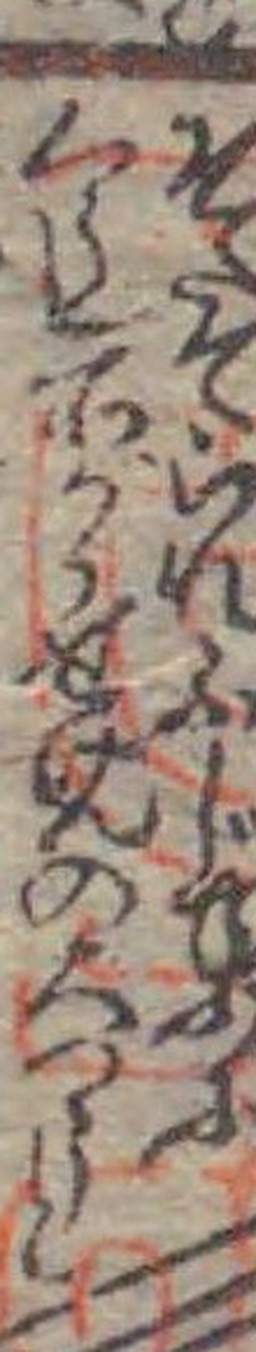くらし所からせけんの大つうと
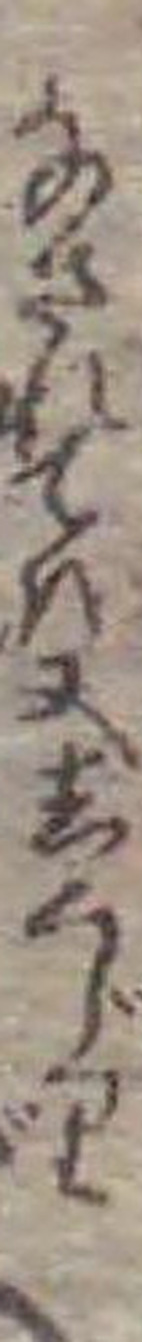なされては又しくじりだ
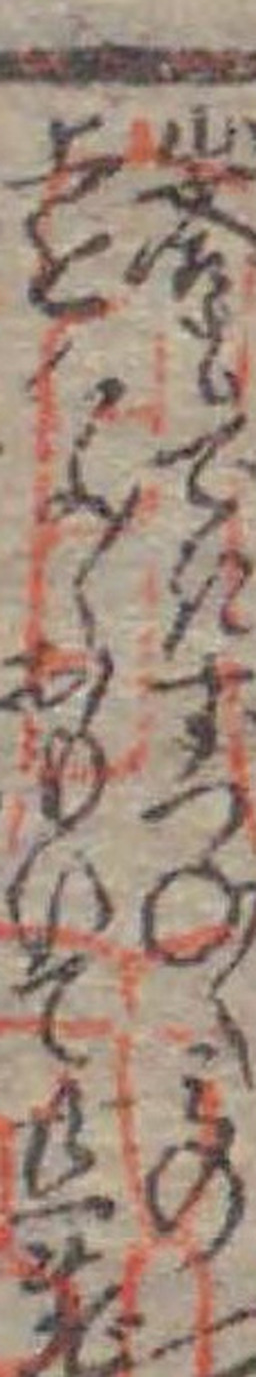上をくよ〳〵おもいて廿一まで
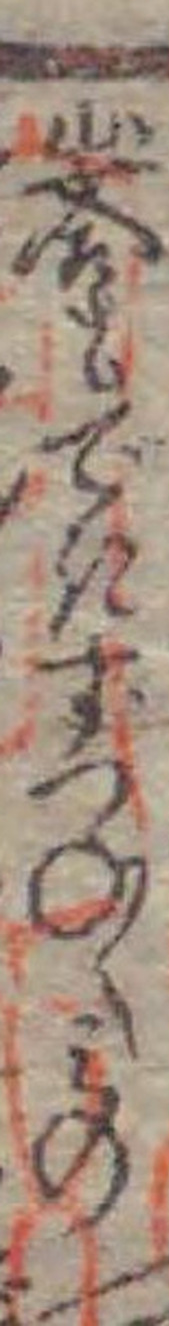出合もできずつね〳〵みの
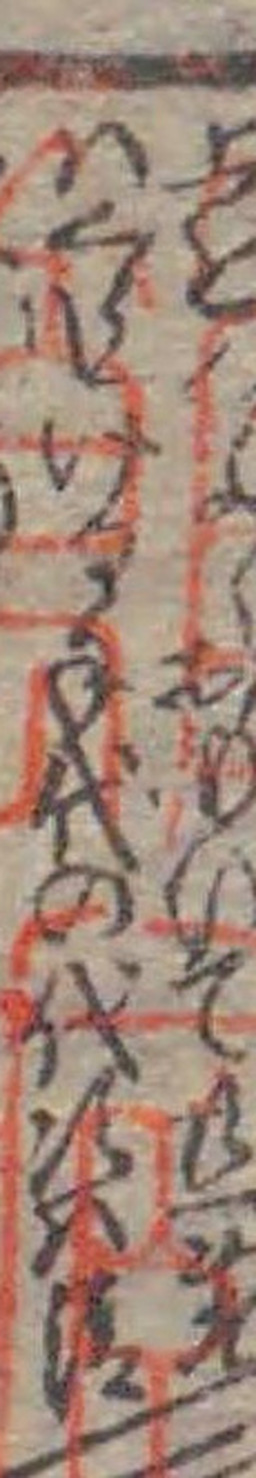はくらしける手代の代次は清
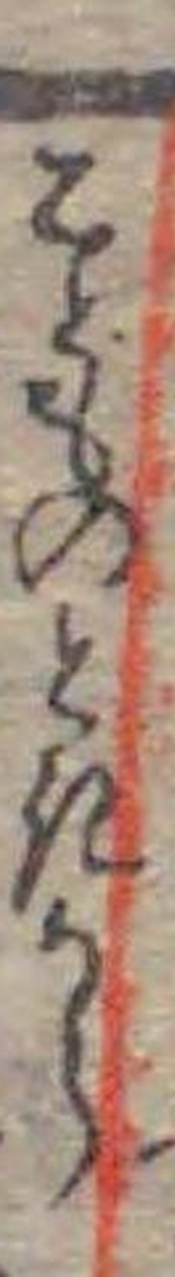ことものときから
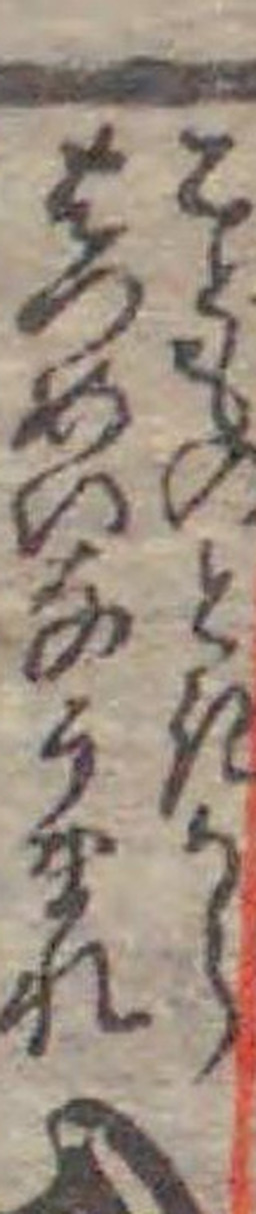はつめいなうまれ
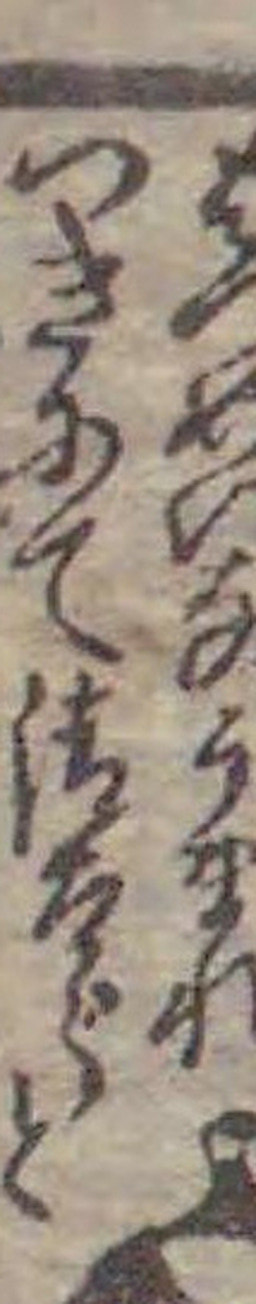つきにて清太郎と
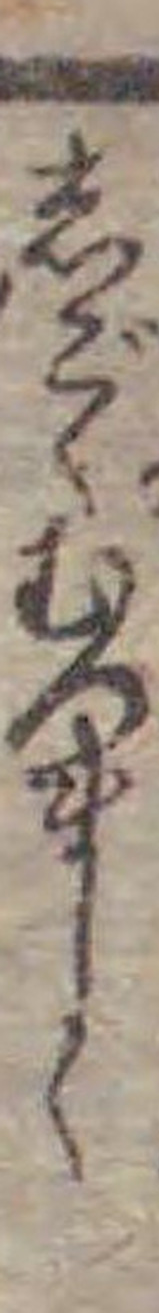しごくむつましく
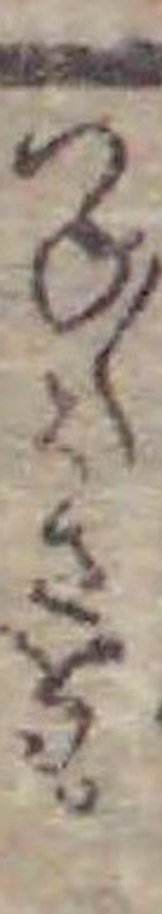つね〳〵うさをも
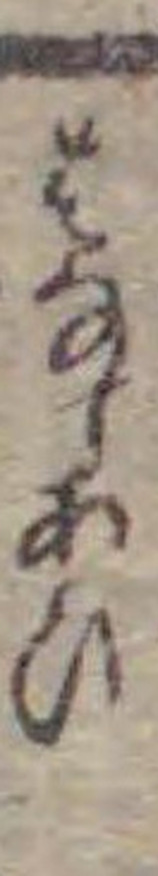はなしあひ

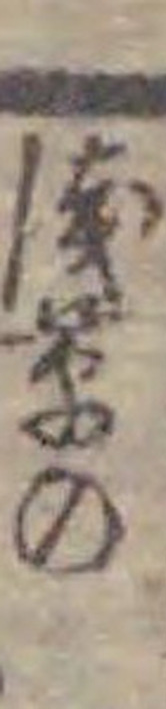浅草の
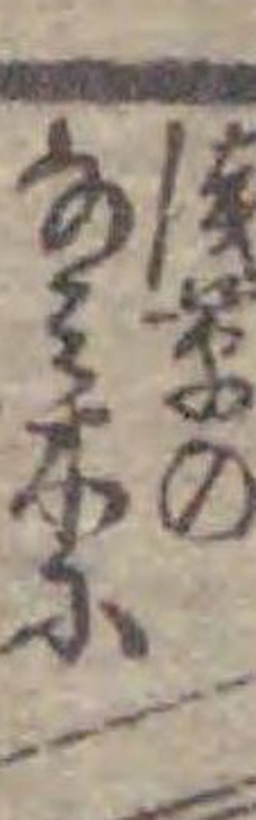なみ木に
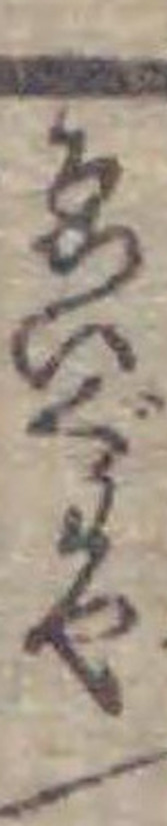ゑいぐわや
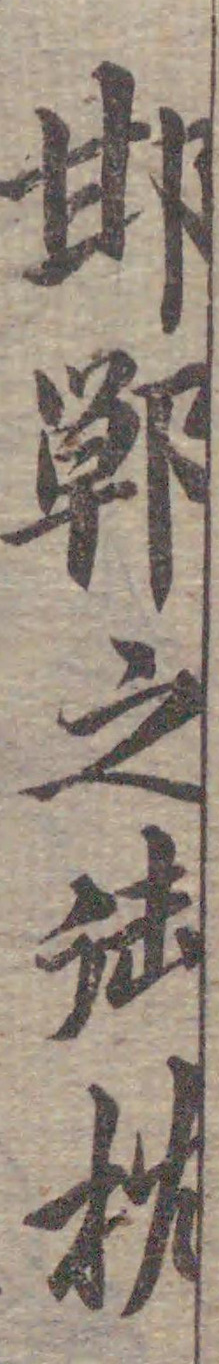邯鄲之御枕
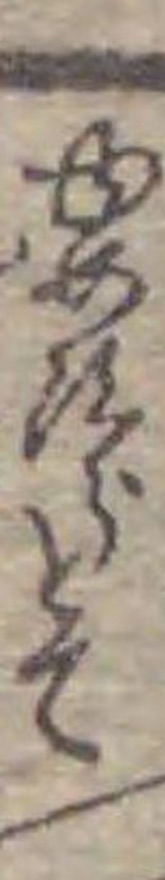ゆめ次郎とて
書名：見徳一炊夢 : 3巻
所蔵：国立国会図書館 National Diet Library, JAPAN
